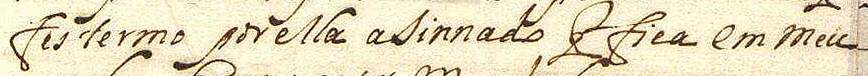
fes termo por ella asinnado q̄ fica em meu
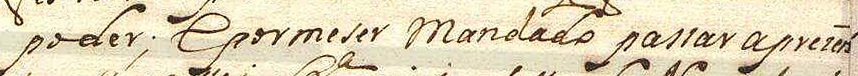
poder; E por me ser mandado passar a prezen
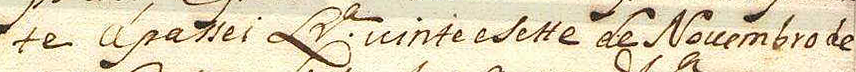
te a passei Lr.a uinte e sette de Nouembro de
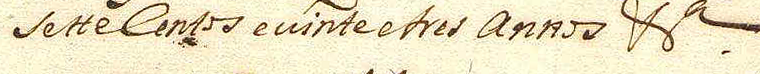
setteCentos e uinte e tres annos &a.
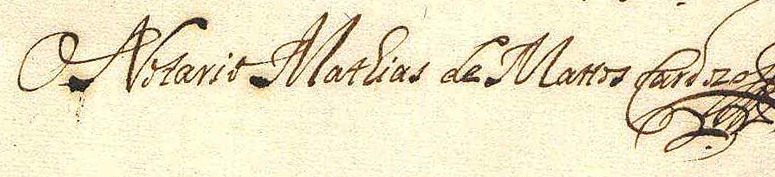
O Notario Mathias de Mattos Cardozo
